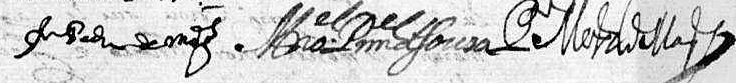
fr Pedro de mages. Mnoel Pim.el d Sousa Po Mexa de Mages
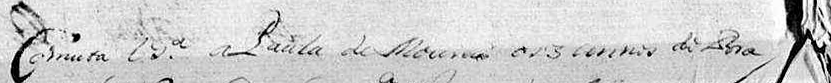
Comuta v s.a a Paula de Moura a 3 annos do Bra
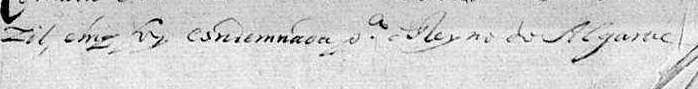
zil, em q foy condemnada p.a o Reyno do Algarue
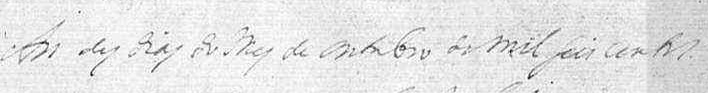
Aos des dias do Mes de Outubro de mil seiscentos
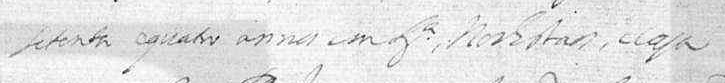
setenta e quatro annos em Lx.a, nos Estaos, e casa
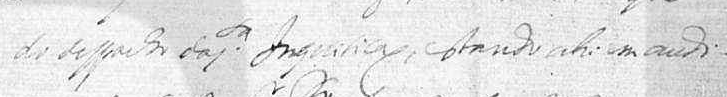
do despacho da s.ta Inquisiçaõ, estando ahi em audi
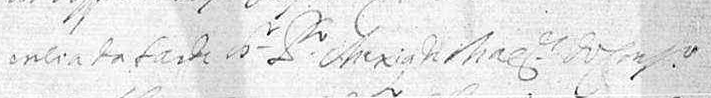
encia da tarde o sr. P.o Mexia de Mag.es do Cons.o
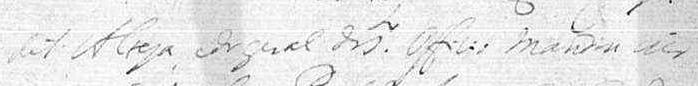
de S. Alteza, e do geral do s.to Officio mandou uir
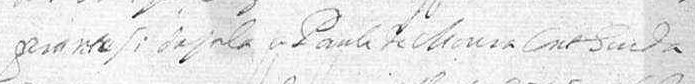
perante si da sala a Paula de Moura contheuda
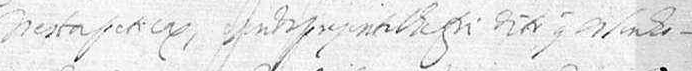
nesta petiçaꝭ, e sendo presente lhe foi dito q̄ os senho
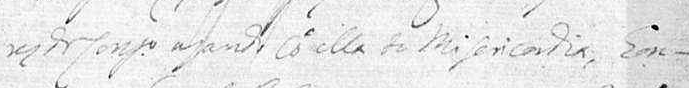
res do Conso usando cō ella de Misericordia, hou
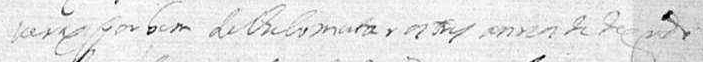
ueraꝭ por bem de lhe comutar os tres annos de degredo
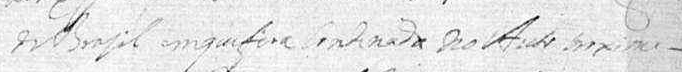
de Brazil em que fora condenada no Auto proximo
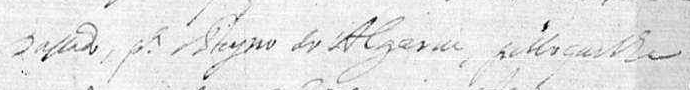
passado, p.a o Reyno do Algarue, pello que lhe
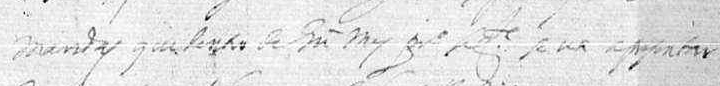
mandaꝭ que dentro de hū mes pxo segte se ua apresentar
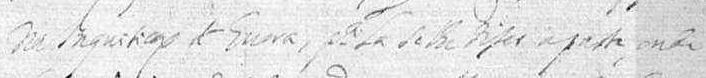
na Inquisiçaꝭ de Euora, pa la se lhe diser a parte, onde
